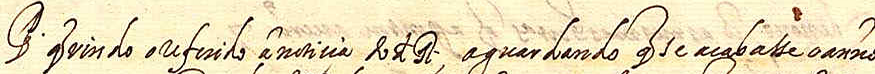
P. q̄ vindo o referido â notiçia do d̄ R., aguardando q̄ se acabasse o ann̄o
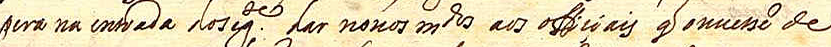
pera na entrada do segte. dar nouos mdos aos offiçiais q̄ ouuessē de
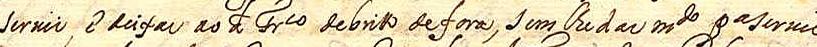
seruir, e deixar ao d̄ Frco de britto de fora, sem lhe dar mdo pa seruir
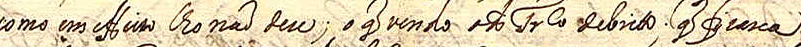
como em effeito lho naõ deu: o q̄ vendo o d̄ Frco de britto; q̄ ficaua
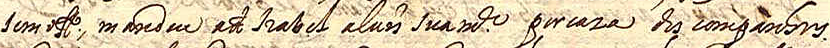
sem offo., mandou a d̄ Izabel alues̄ sua m.er por caza dos companhros.
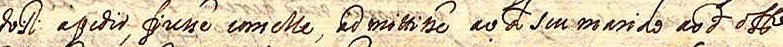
do R. a pedir, fizessē com elle, admittissē ao d̄ seu marido do d̄ offo
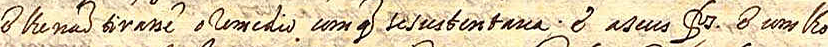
e lhe naõ tirassē o Remedio com q̄ se sustentaua. e a seus fos. e com lho
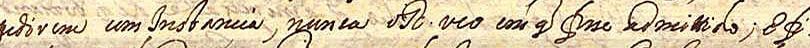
pedirem com Instançia, nunca o R. veo em q̄ fosse admittido; e fi
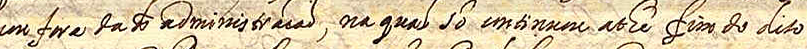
cou fora da d̄ administracão, na qual sô continuou athê fim do dito
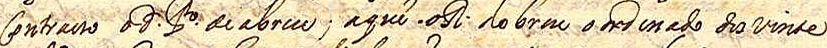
Contracto o d̄. Po. de abreu; a quē o R dobrou o ordenado dos vinte
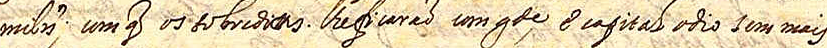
mil rs̄: com q̄ os sobredittos lhe ficaraõ com gde e capital odio sem mais
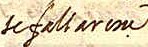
se fallarem.
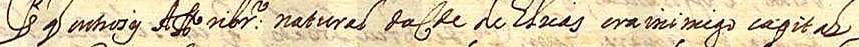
P q̄ outrosy Affo ribro: natural da Cde de Eluas era inimigo capitaL
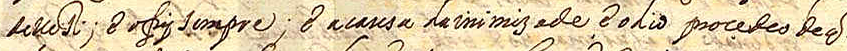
delle R; e o foj sempre; e a causa da inimizade e odio procedeo de q̄
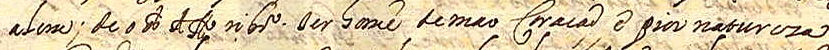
alem; de o d̄ Affo ribro. ser homē de mao Coraçaõ, e pior natureza
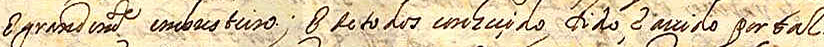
e grandemte embusteiro; e de todos conheçido, tido, e auido por tal
